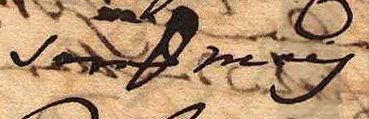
saraõ mais
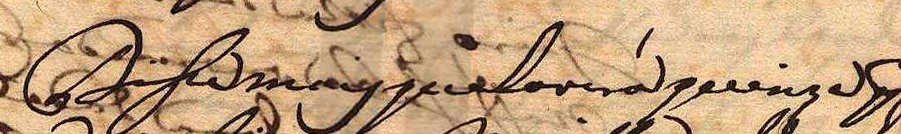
Disse mais que havera quinze pa
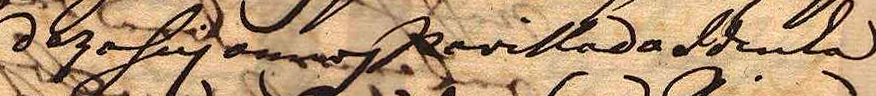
dezaseis annos na villa da Idanha
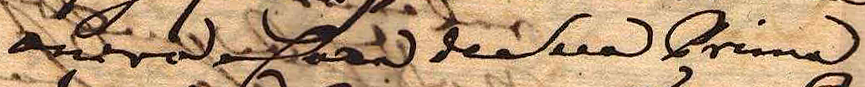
a nova e Caza de Sua Prima
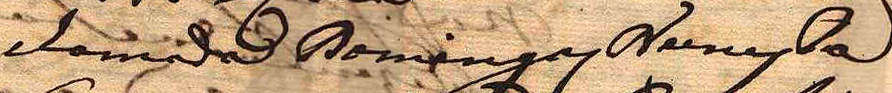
chamada Domingas Nunes Pa
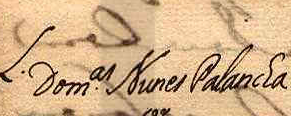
L. Dom.as Nunes Palancha
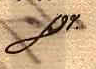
pr.
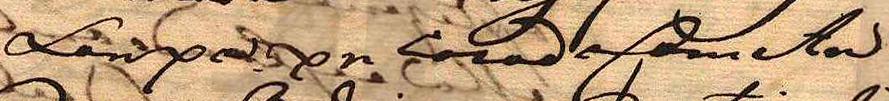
Lanxa xn cazada Com An
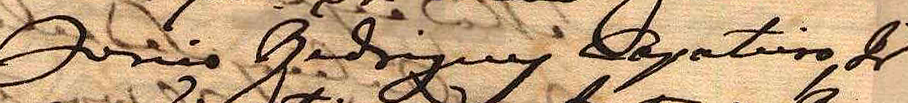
tonio Rodrigues Capateiro Ir
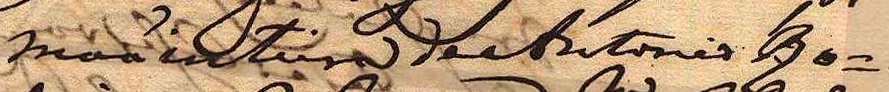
maã inteira de Antonio Ro
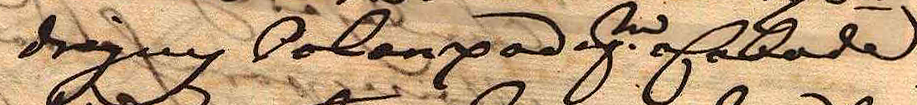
drigues Polanxa de q.m aCaba de
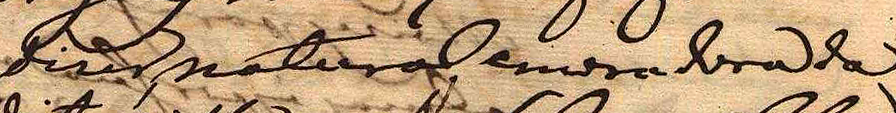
dizer natural e moradora da
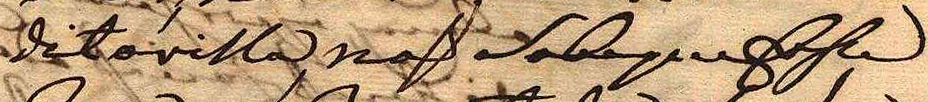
dita villa naõ sabe que fosse
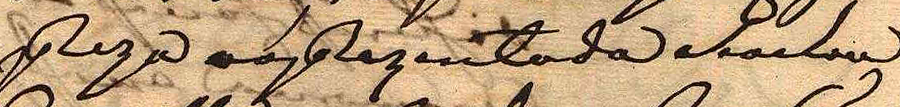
pReza o apRezentada se achou
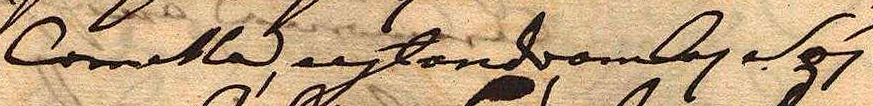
Com ella, e estando ambas sós
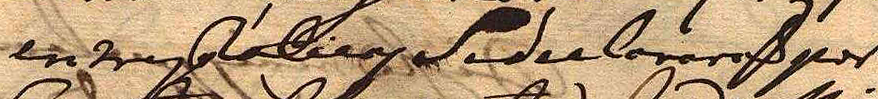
entre pRaticas se declararaõ por
